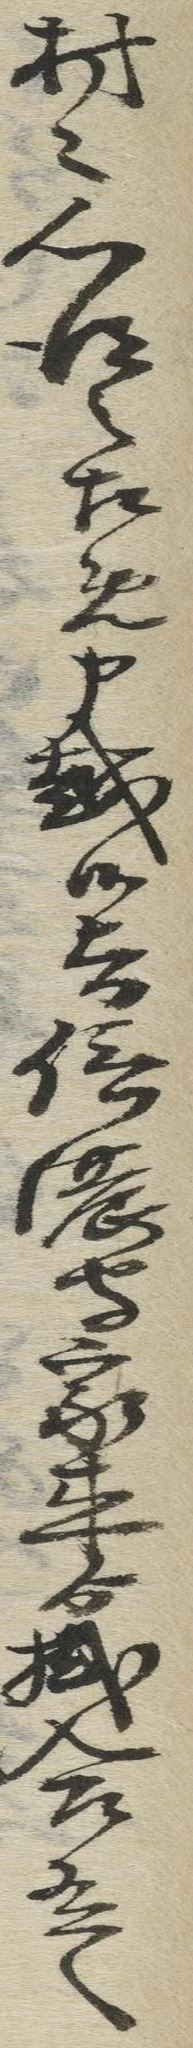村々心得候ため申越候旨信濃守家来ゟ掛合有之
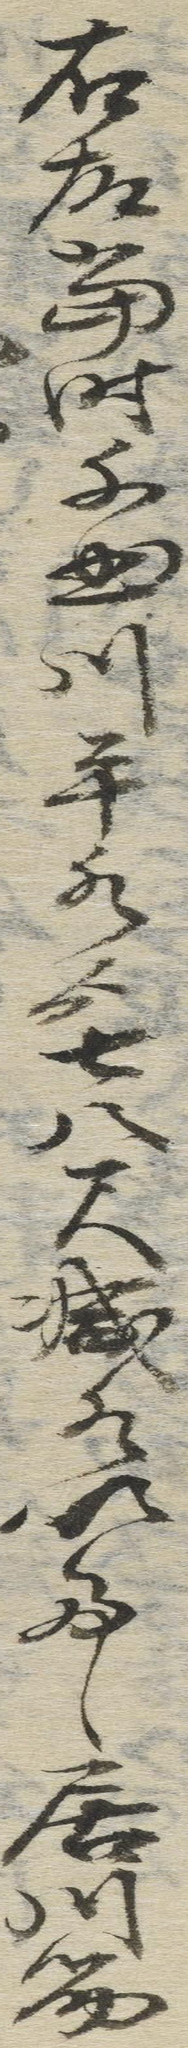右故当時千曲川平水ゟ七八尺減水いたし居川筋
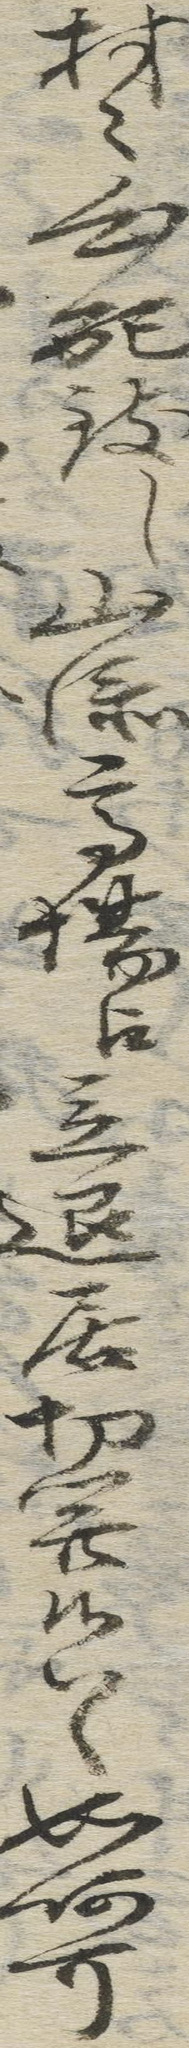村々心配致し山添高場江立退居切開候ハゝ如何可
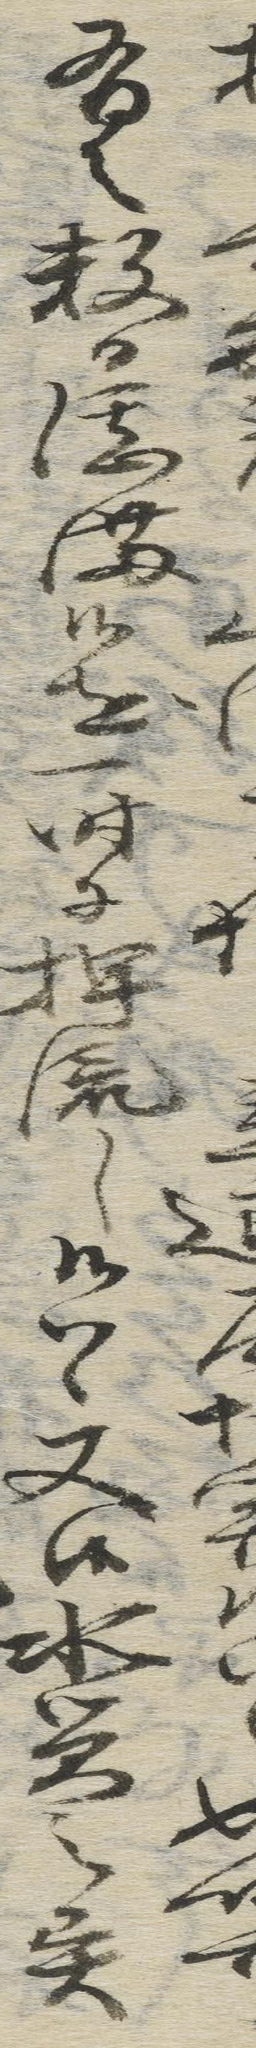有之数日湛溜候を一時に押流し候ハゝ又々水災之異
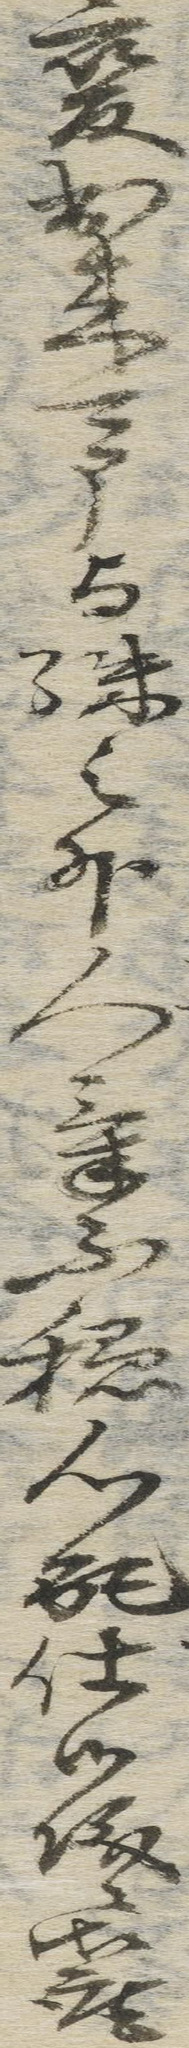変出来可申と殊之外人気不穏心配仕候儀二御座候
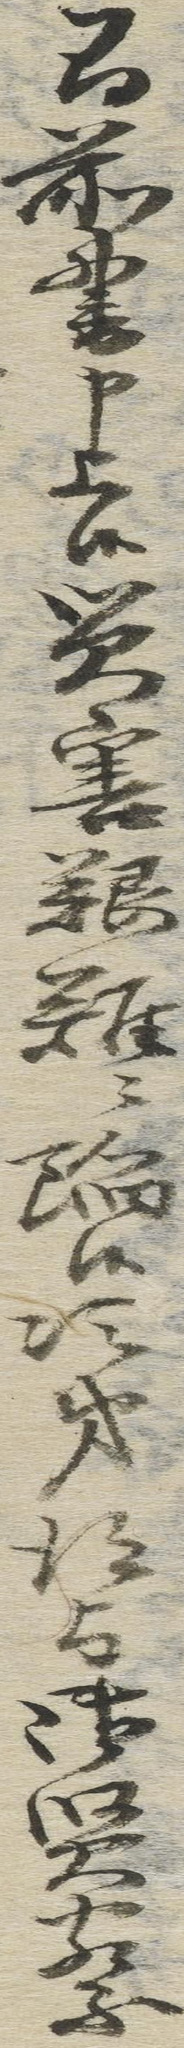間前書申上候災害艱難二陥候次第得と御賢察
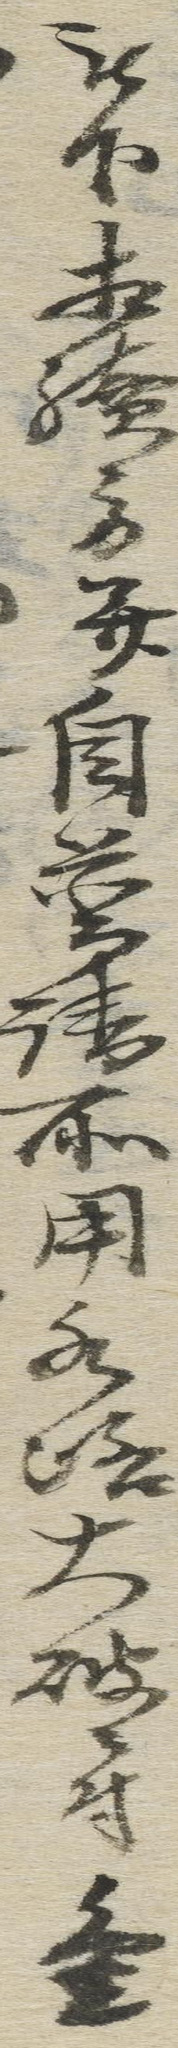被下相続方并自普請所用水路大破二付金
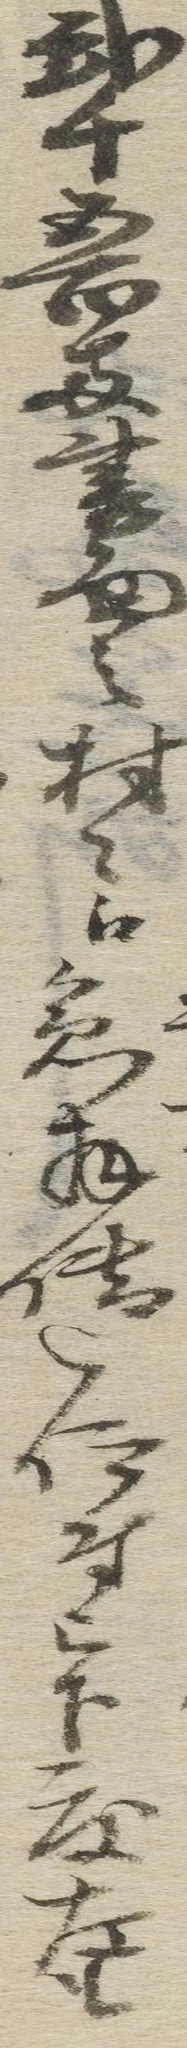弐千五百両書面之村々江急拝借被仰付被下度左も
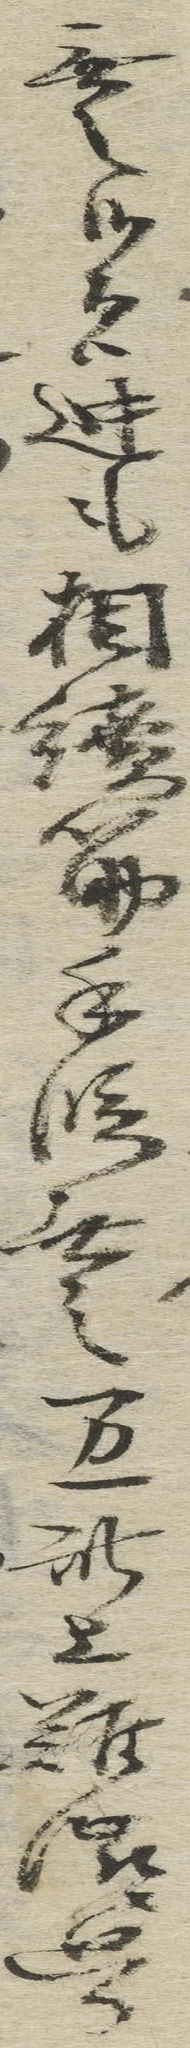無之候而ハ迚も相続筋手段無之万一此上難渋二迫り
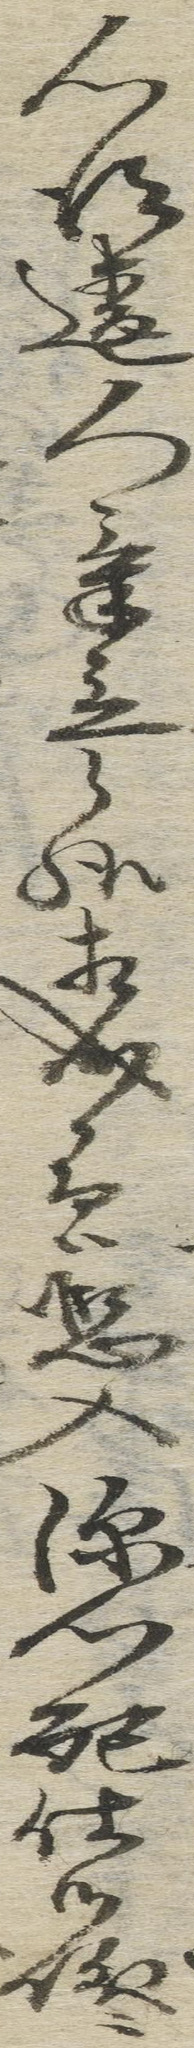心得違人気立候様相成候而ハ恐入深心配仕候儀二
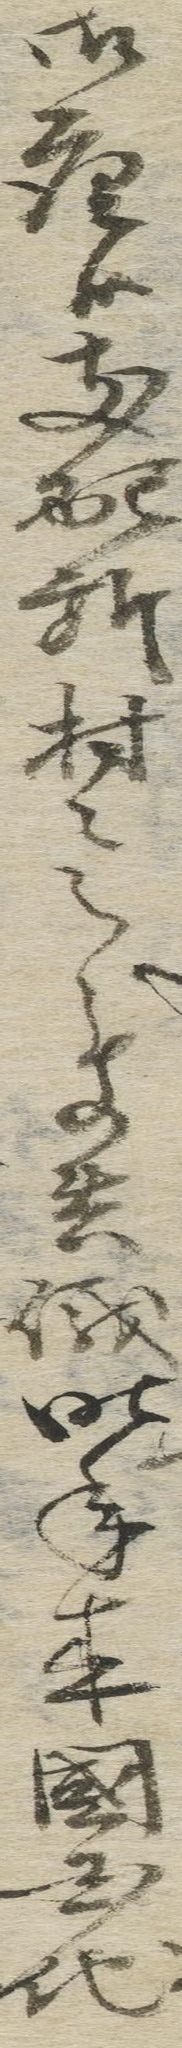御座候支配所村々之もの共儀昨年来国国他
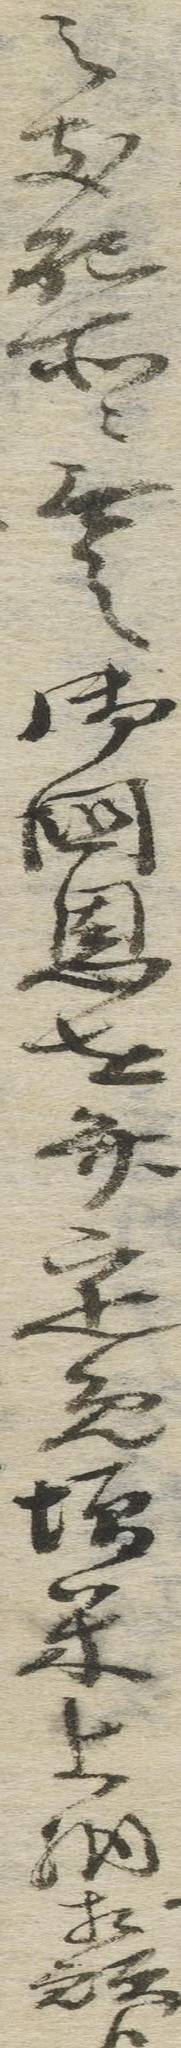之支配所二無之御国恩を弁定免増米上納相願候
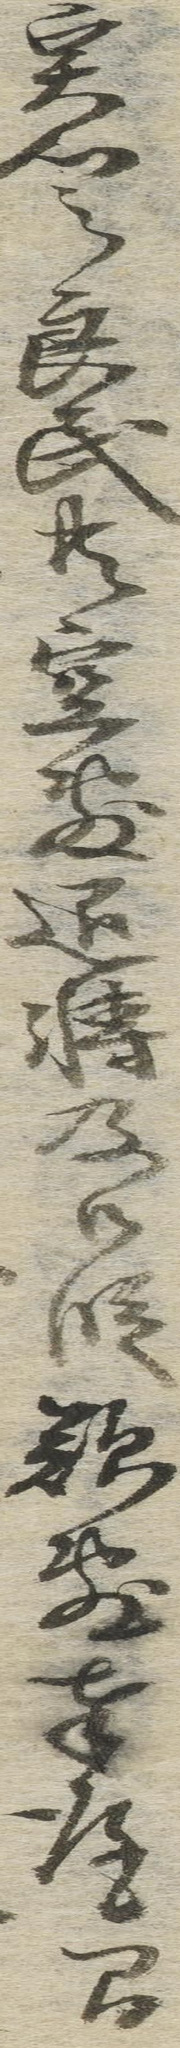実以之良民共空敷退転及候段歎敷奉存候間
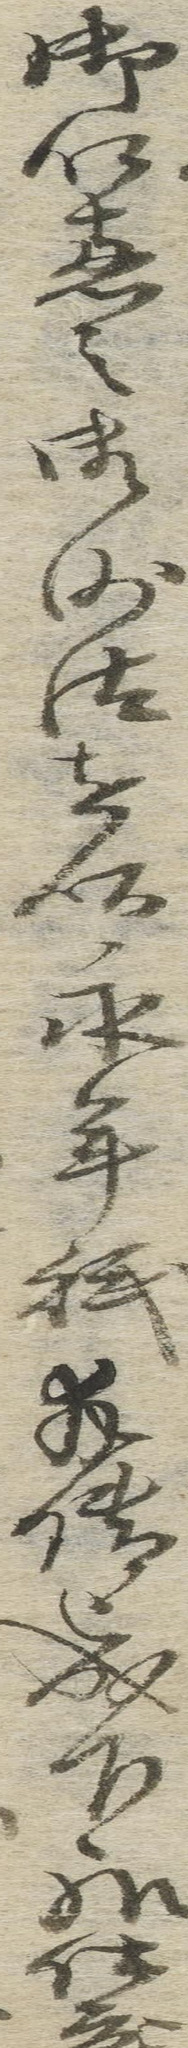御仁恵之御沙汰を以永年賦拝借被下候様仕度
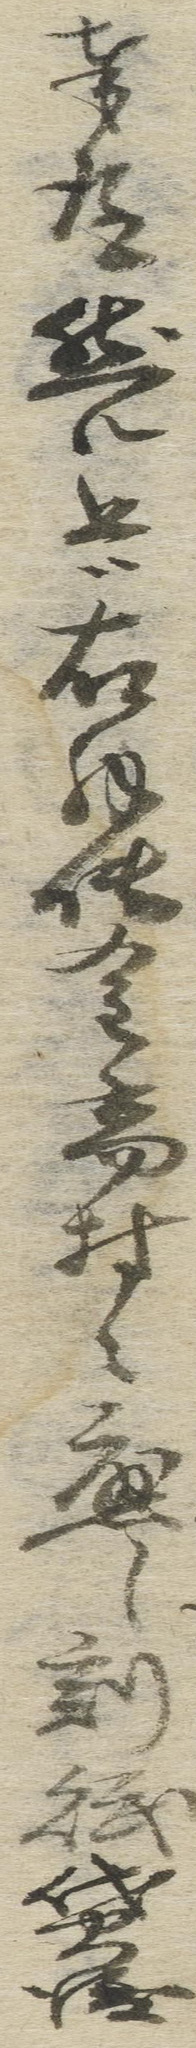奉存候然ㇽ上ハ右拝借金高村々応し割符貸渡

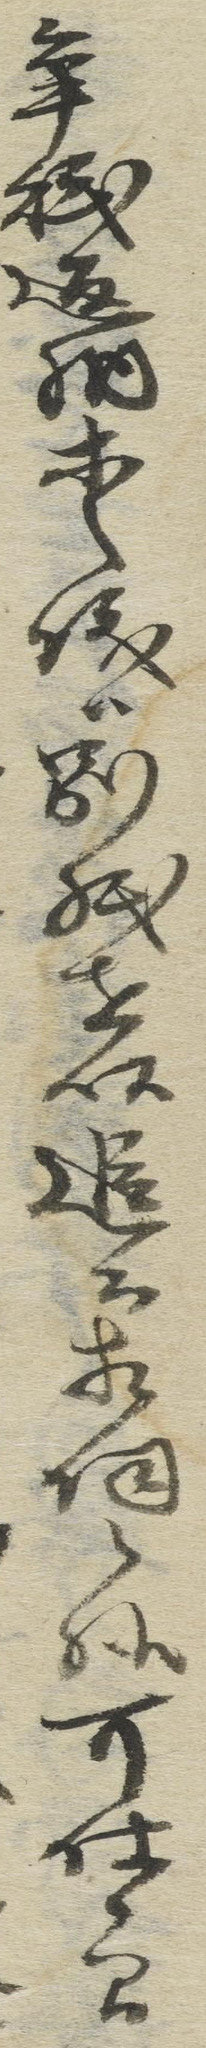年賦返納等之儀ハ別紙を以追而相伺候様可仕候間
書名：信濃越後　地震書留
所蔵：東京大学地震研究所図書室 Earthquake Research Institute Library, The University of Tokyo, JAPAN
